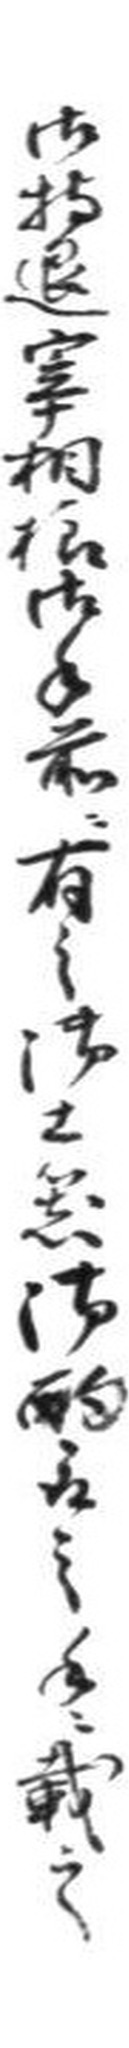御持退宰相様御手前ニ有之御土器御酌取之手ニ載之
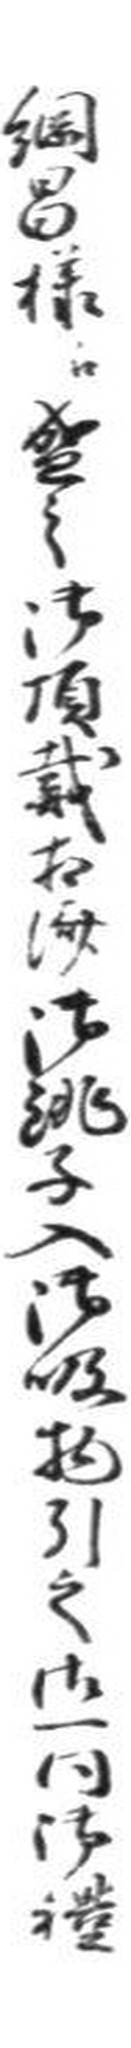綱昌様江盛之御頂戴相済御銚子入御吸物引之御一同御礼
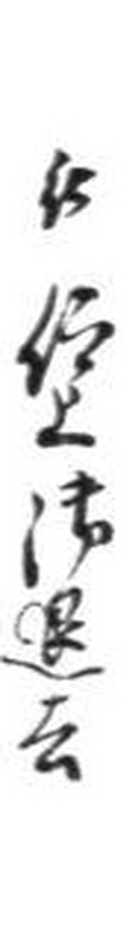被仰上御退去
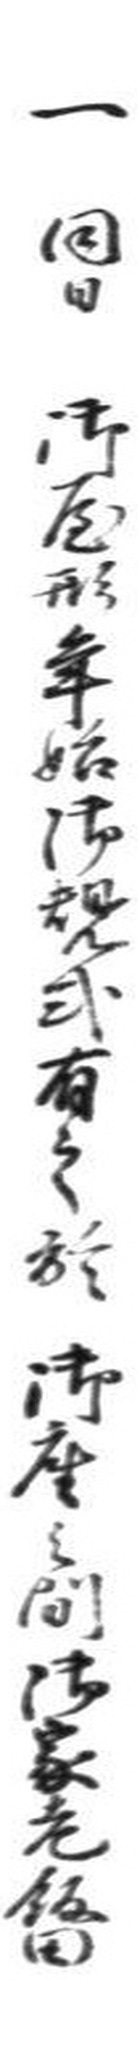一同日御屋形年始御規式有之於御座之間御家老飯田
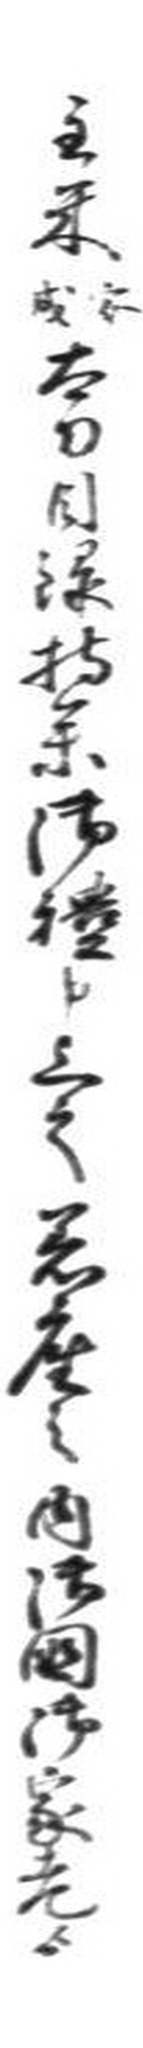主米安成太刀目録持参御礼申上之着座之内御国御家老ゟ
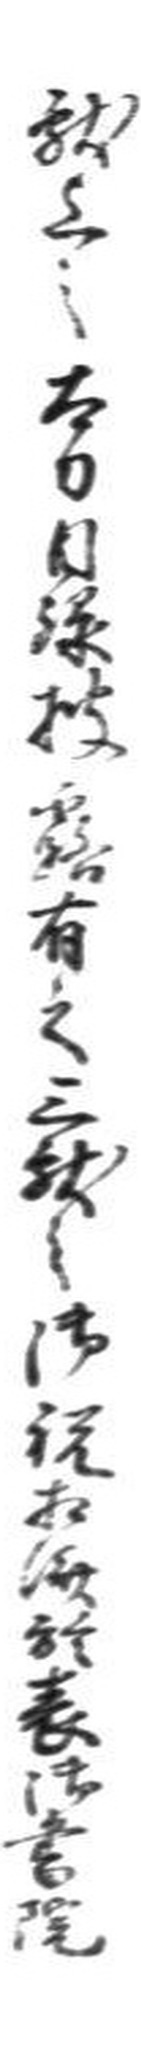献上之太刀目録披露有之三献之御祝相済於表御書院
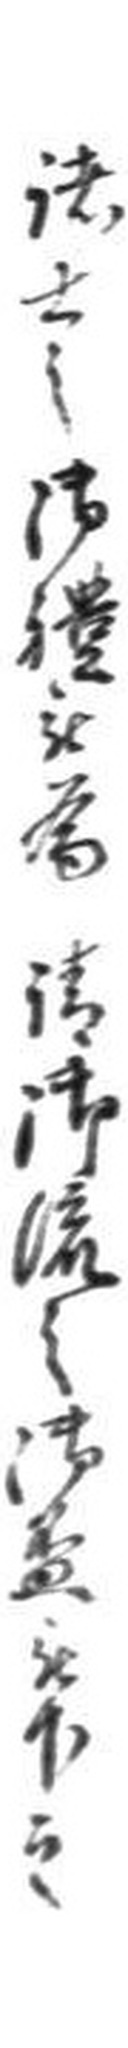諸士之御礼被為請御流之御盃被下之
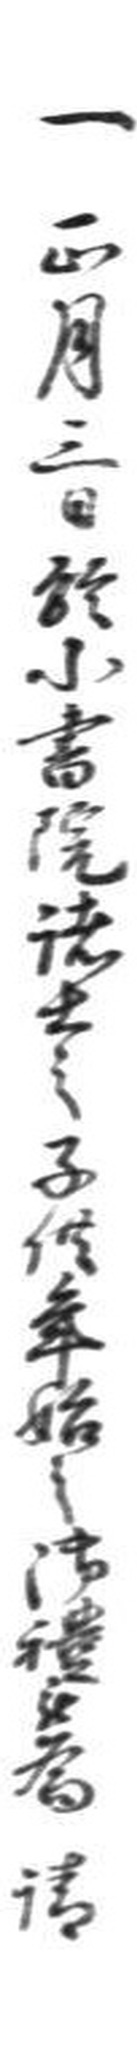一正月三日於小書院諸士之子供年始之御礼被為請
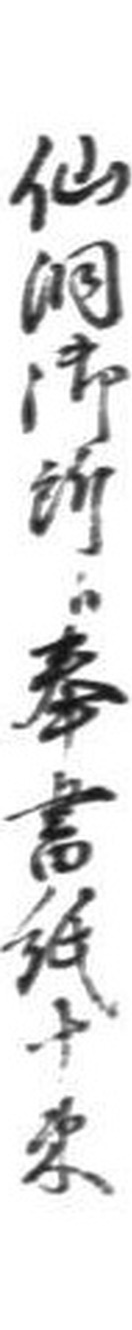仙洞御所江奉書紙十束

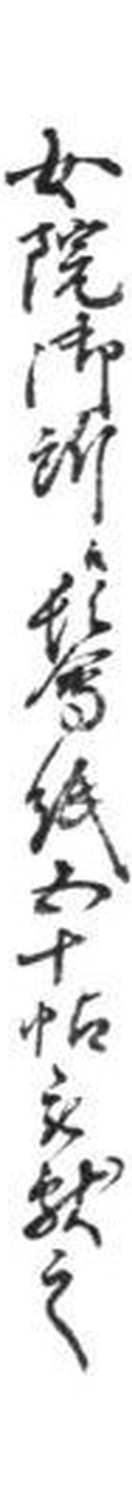女院御所江鬠紙五十帖被献之
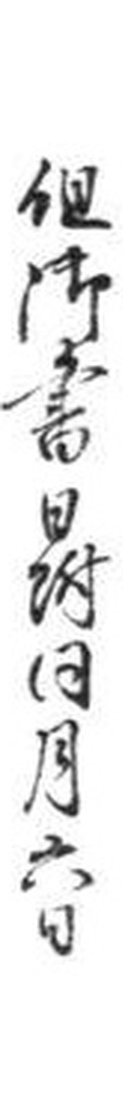但御書日附同月六日
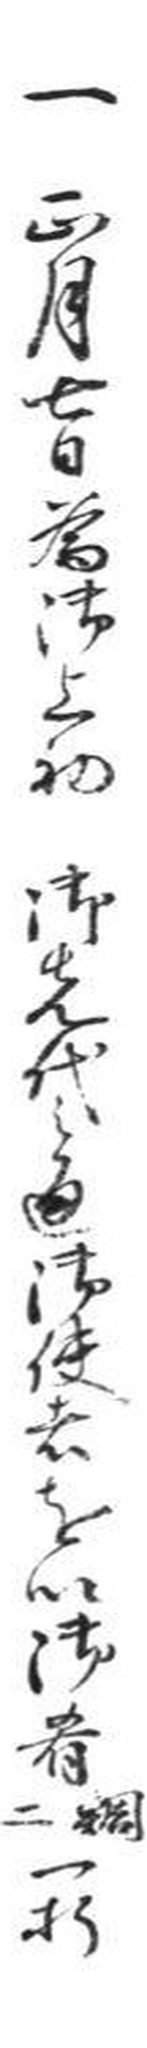一正月七日為御上初御先代之通御使者を以御肴鯛二一折
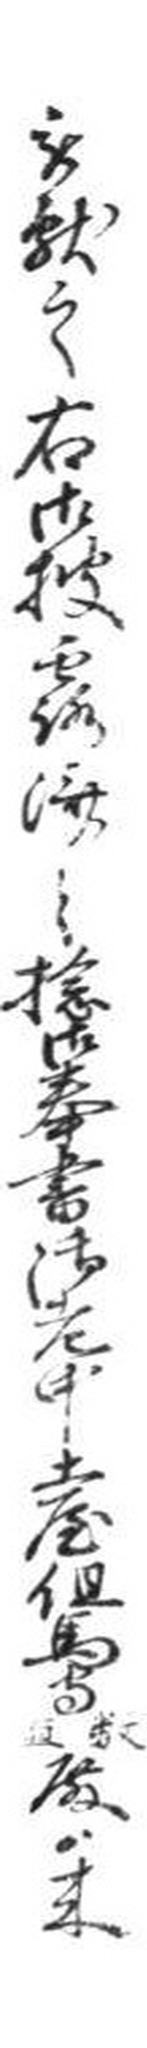被献之右御披露済之捻御奉書御老中土屋但馬守数直殿ゟ来
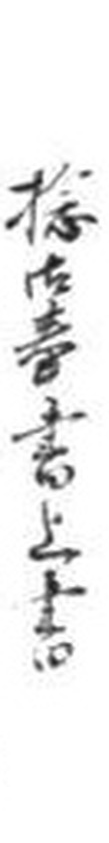捻御奉書上書
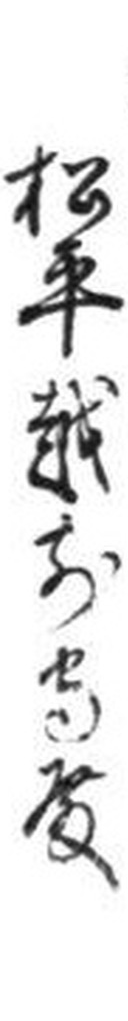松平越前守殿
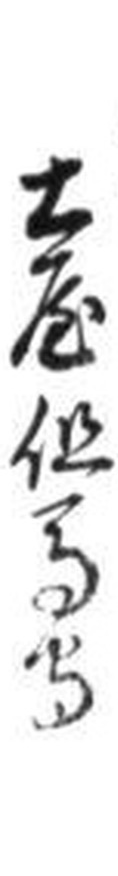土屋但馬守
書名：家譜 十三 綱昌公 従寛文元年到延宝五年
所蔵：福井県文書館 Fukui Prefectural Archives
